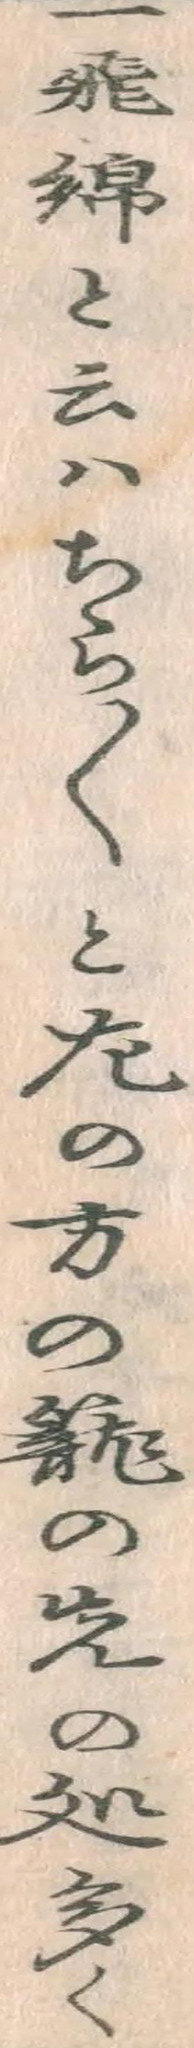一飛綿と云はちら〳〵と左の方の籠の先の処多く
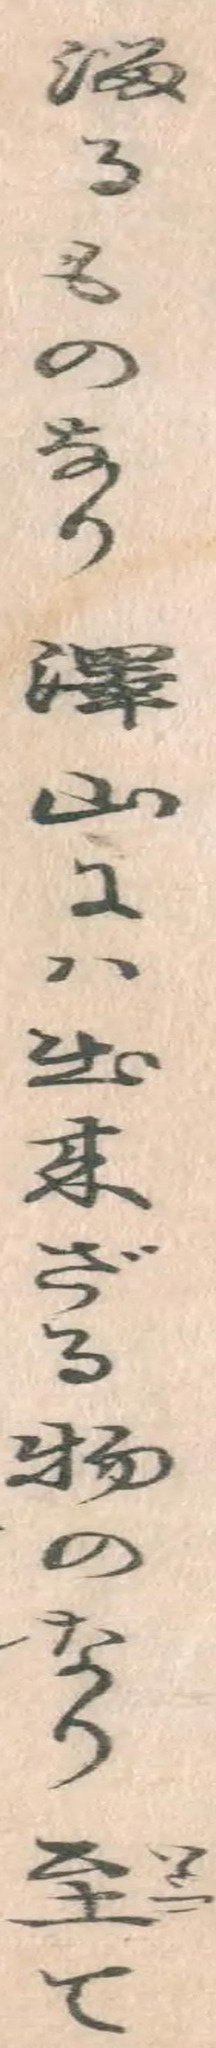溜るものなり沢山には出来ざる物のなり至て
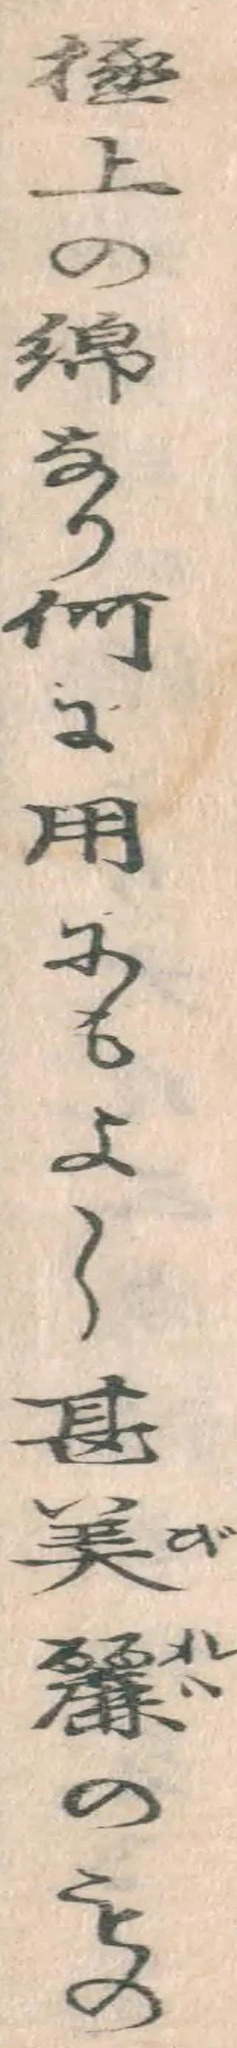極上の綿なり何に用にもよし甚美麗のもの

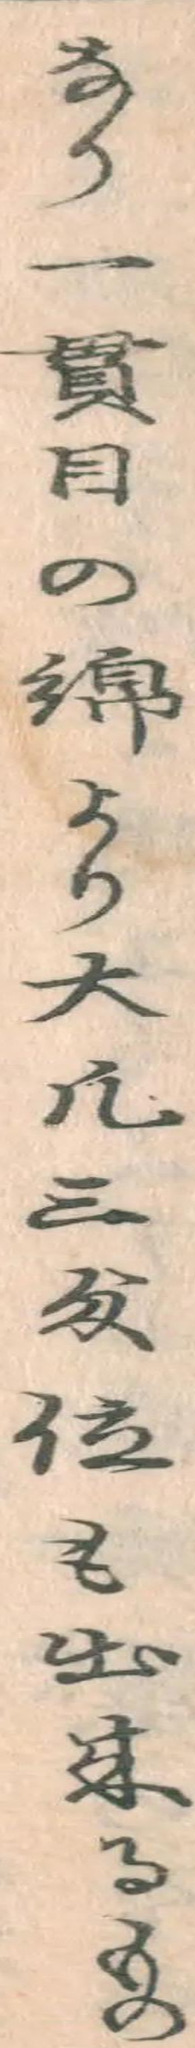なり一貫目の綿より大凡三匁位も出来るもの
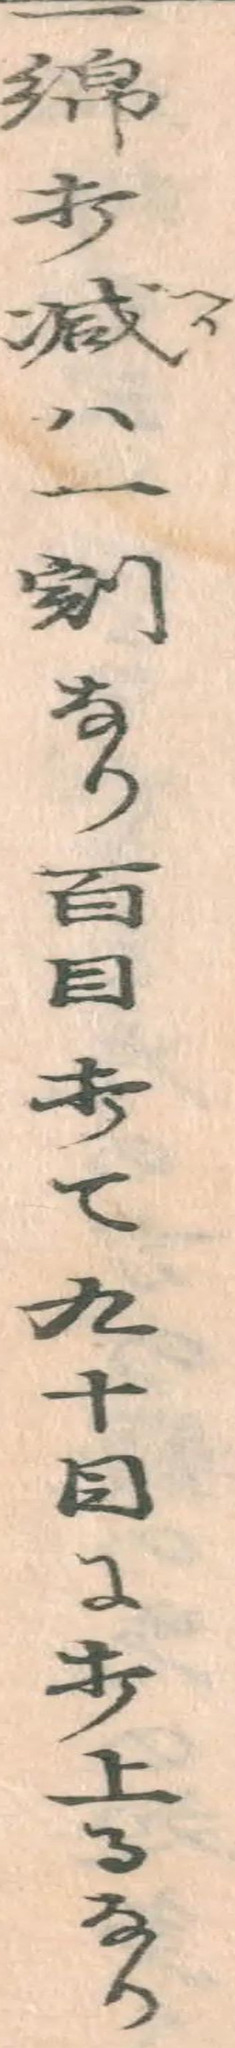一綿打減は一割なり百目打て九十目に打上るなり
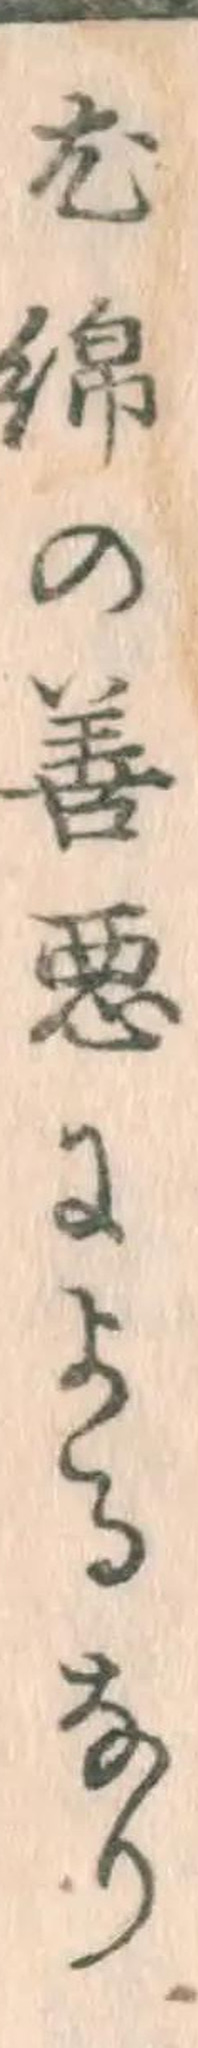尤綿の善悪によるなり
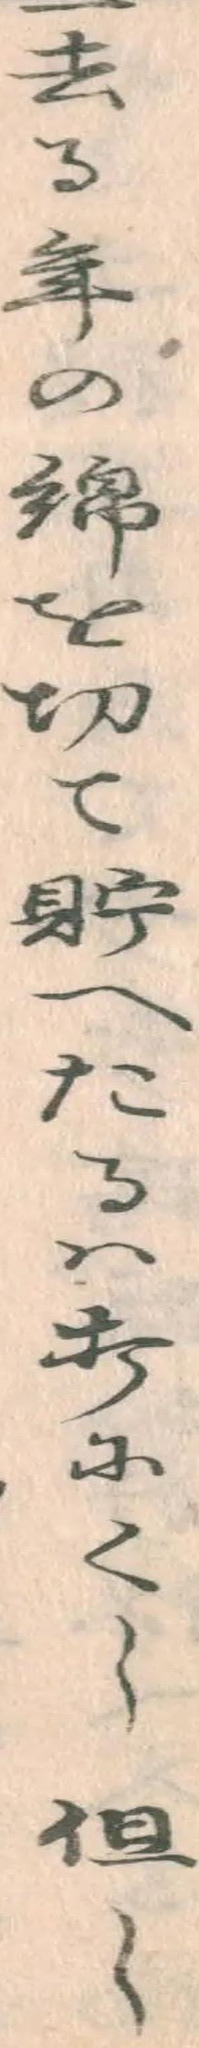一去る年の綿を切て貯へたるは打にくし但し
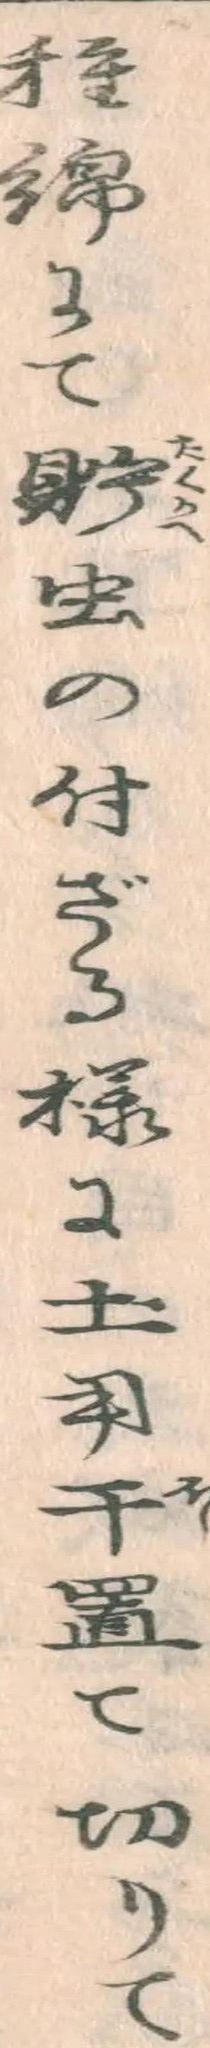種綿にて貯虫の付ざる様に土用干置て切りて
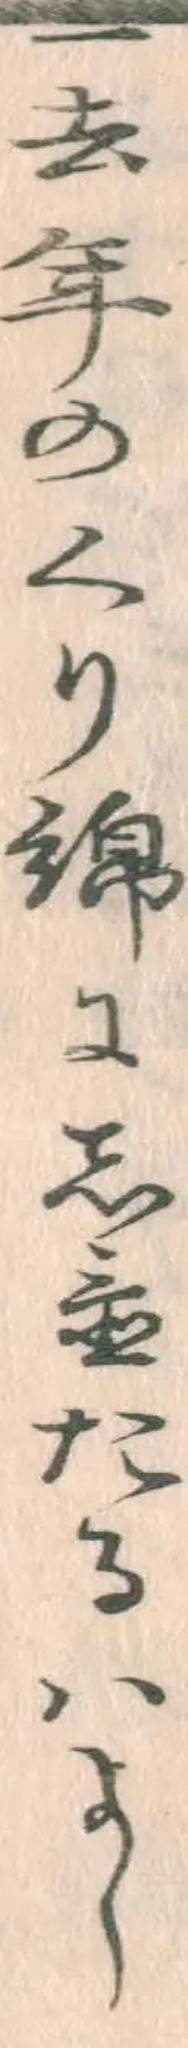一去年のくり綿にし置たるはよし
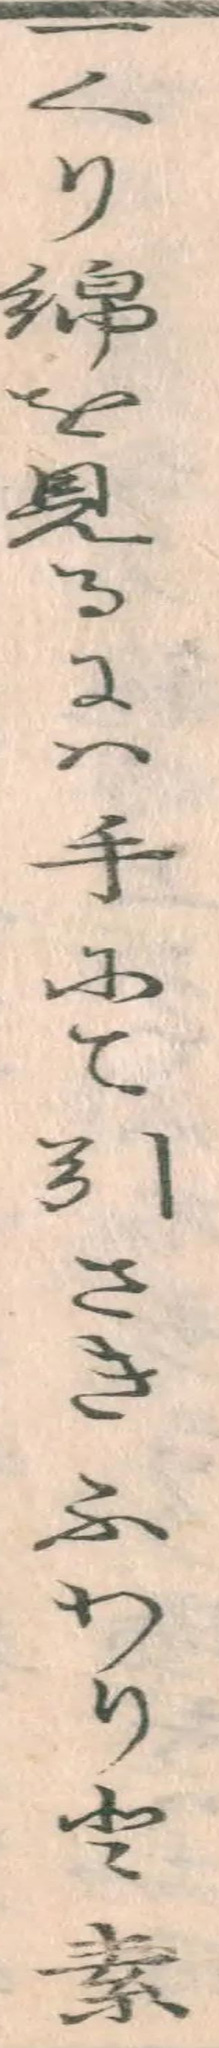一くり綿を見るには手にて引さきふわりと素
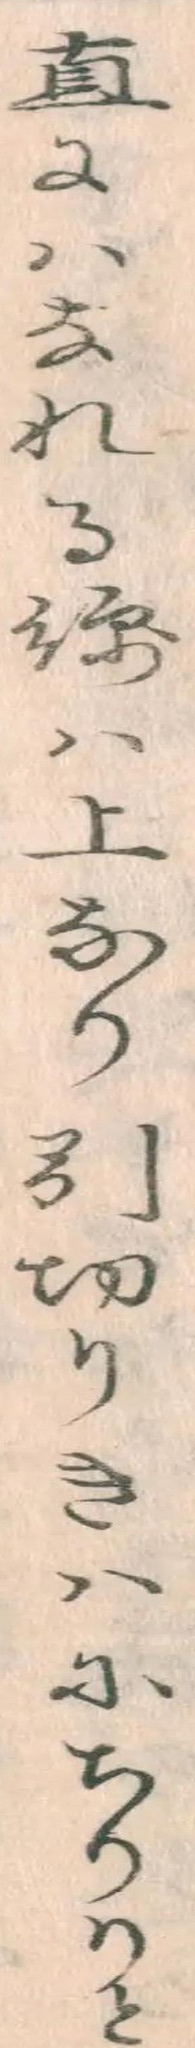直にはなれる綿は上なり引切りきはにちりりと
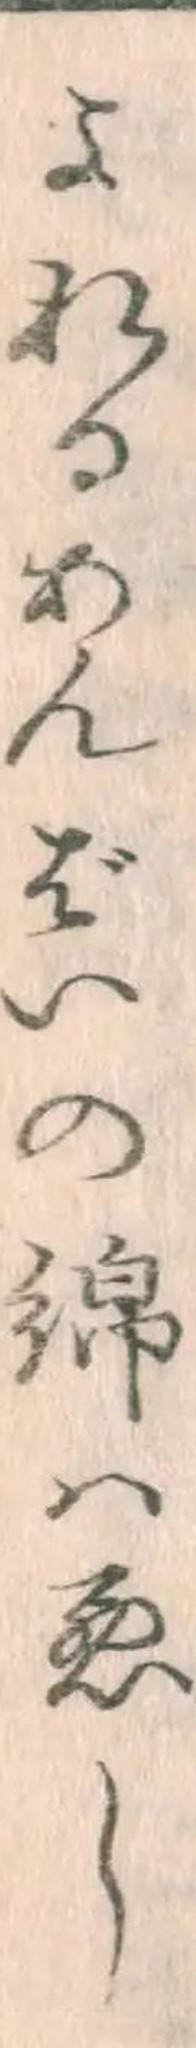よれるあんばいの綿は悪し
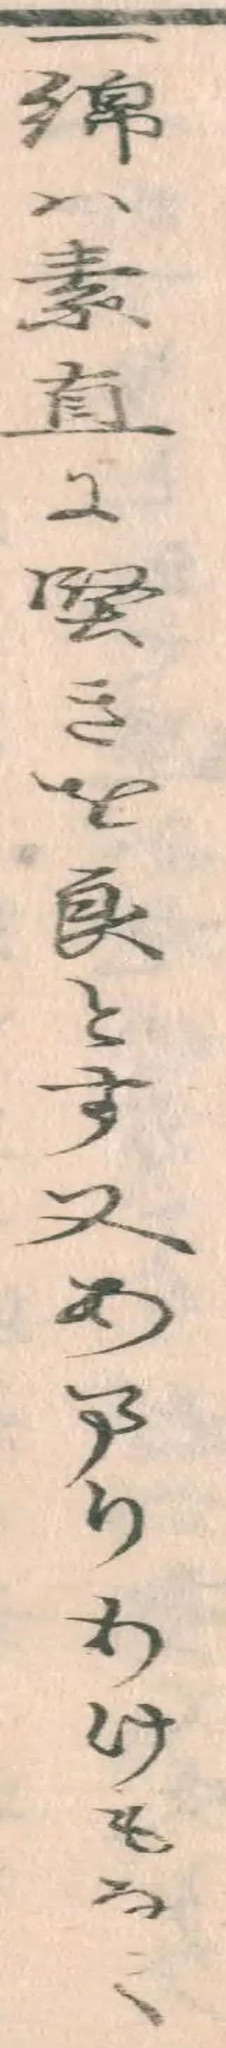一綿は素直に堅きを良とす又あまりわけもなく
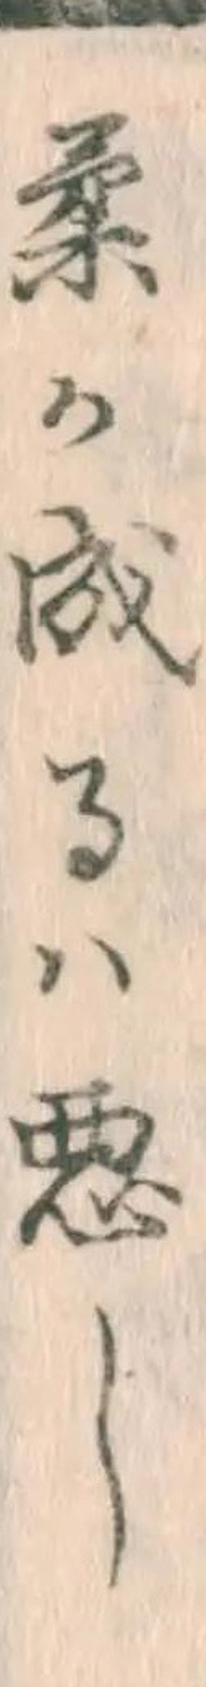柔か成るは悪し
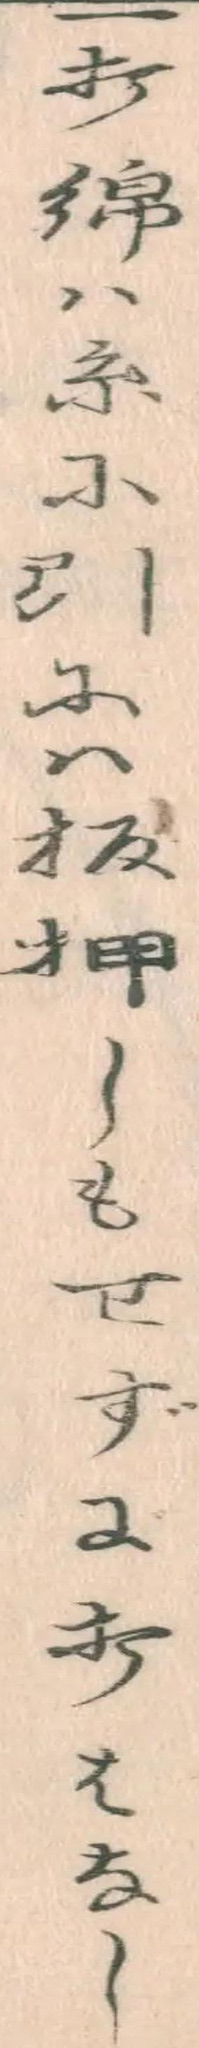一打綿は糸に引には板押しもせずに打はなし
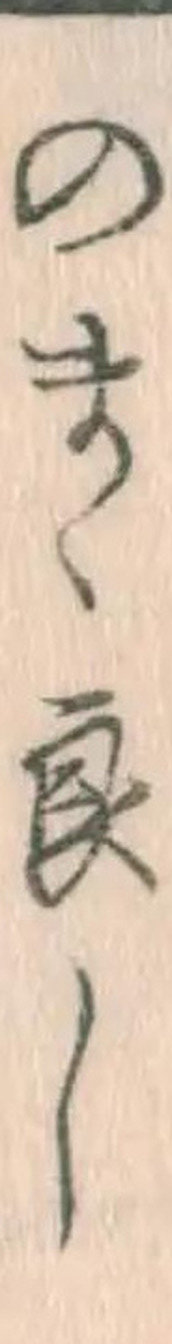のまゝ良し
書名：機織彙編 5巻. [1]
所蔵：国立国会図書館 National Diet Library, JAPAN
